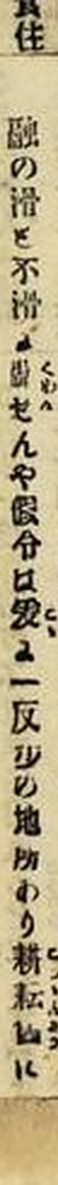融の滑と不滑にせんや假令は爰に一反歩の地所あり耕耘に
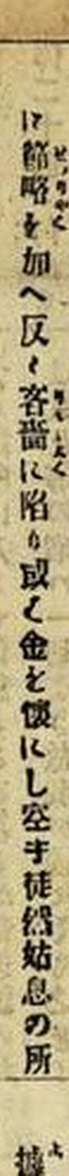に節略を加へ反て吝嗇に陥り或は金を懐にし空于徒然姑息の所
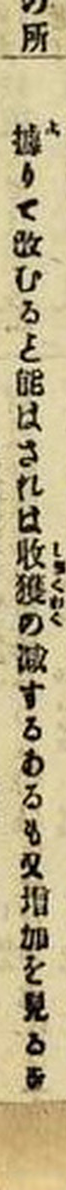拠りて改むること能はされは収獲の減するあるも又増加を見るな
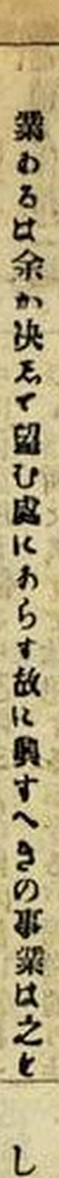業あるは余か決して望む処にあらす故に興すへきの事業は之を
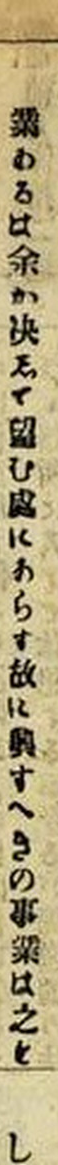業あるは余か決して望む処にあらす故に興すへきの事業は之を
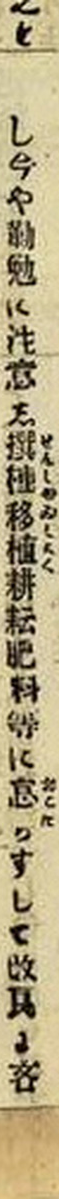し今や勤勉に注意し撰種移植耕耘肥料等に怠らすして改良に吝
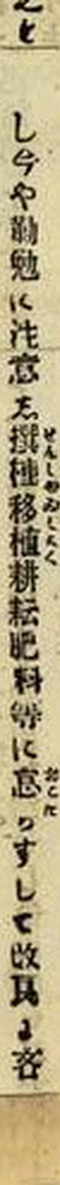し今や勤勉に注意し撰種移植耕耘肥料等に怠らすして改良に吝
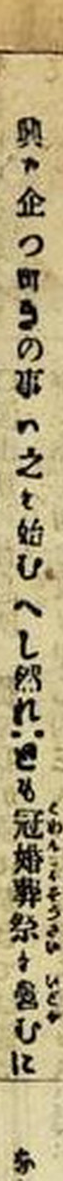興す企つ可きの事は之を始むへし然れとも冠婚葬祭を営むに
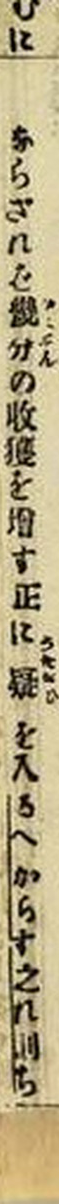ならざれは幾分の収獲を増す正に疑を入るへからす之れ則ち
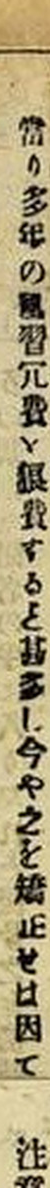当り多年の風習冗費を浪費すること甚多し今や之を矯正せは因て
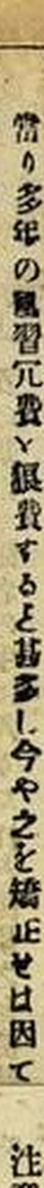当り多年の風習冗費を浪費すること甚多し今や之を矯正せは因て
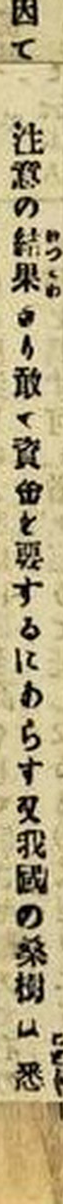注意の結果なり敢て資金を要するにあらす又我国の桑樹は悉
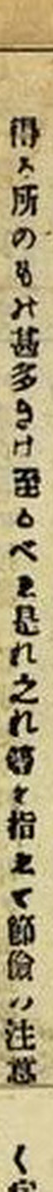得る所のもの甚多き至るべし是れ之れ等を指して節倹の注意
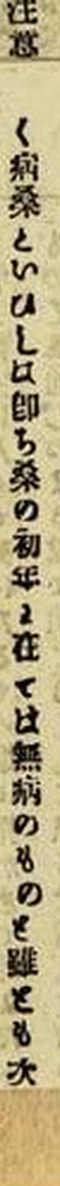く病桑といひしは即ち桑の初年に在ては無病のものと雖とも次
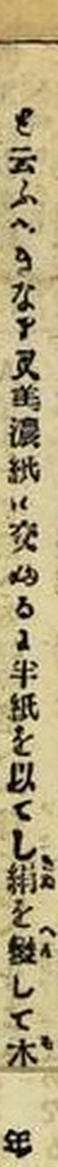と云ふへきなり又美濃紙に交ふるに半紙を以てし絹を変して木
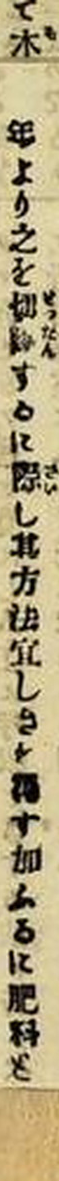年より之を切断するに際し其方法宜しきを得す加ふるに肥料と
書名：温古集 五巻
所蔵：福井県文書館 Fukui Prefectural Archives
